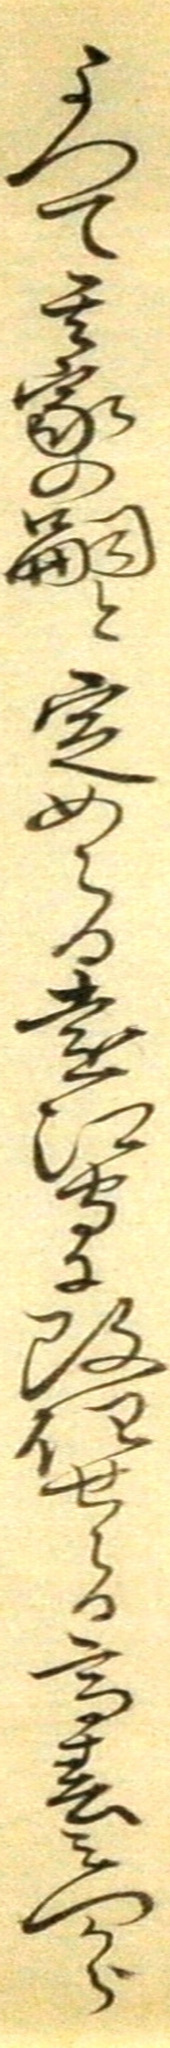よつて其家の嗣と定めらる遠江守に改任せらる高春みつから
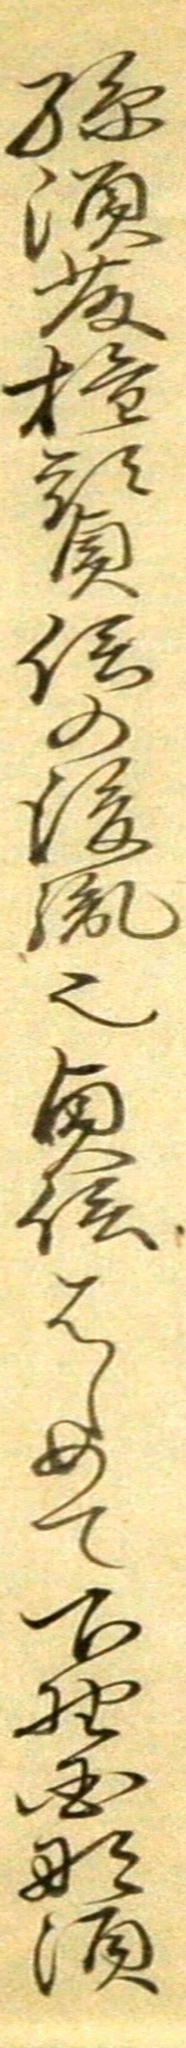孫須藤権頭貞信の後胤也貞信はしめて下野国那須
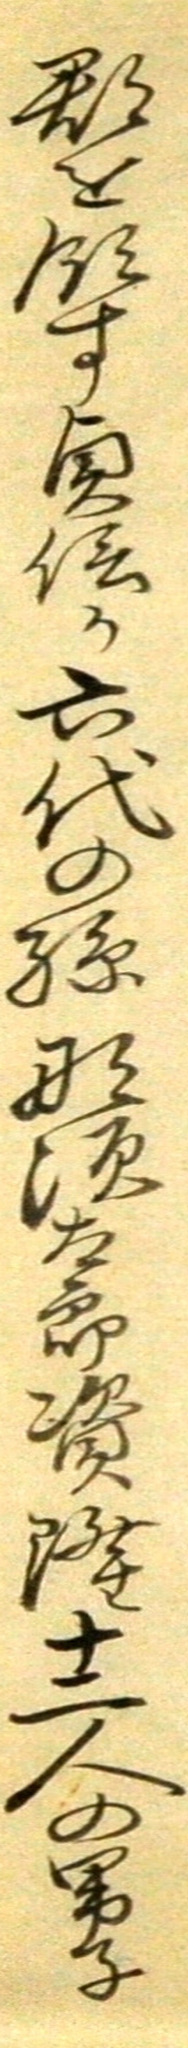郡を領す貞信か六代の孫那須太郎資隆十二人の男子
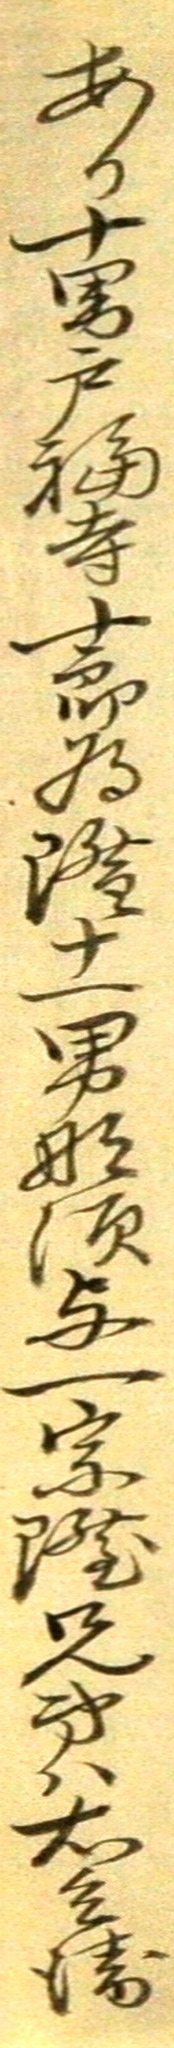あり十男戸福寺十郎為隆十一男那須与一宗隆兄弟は右兵衛

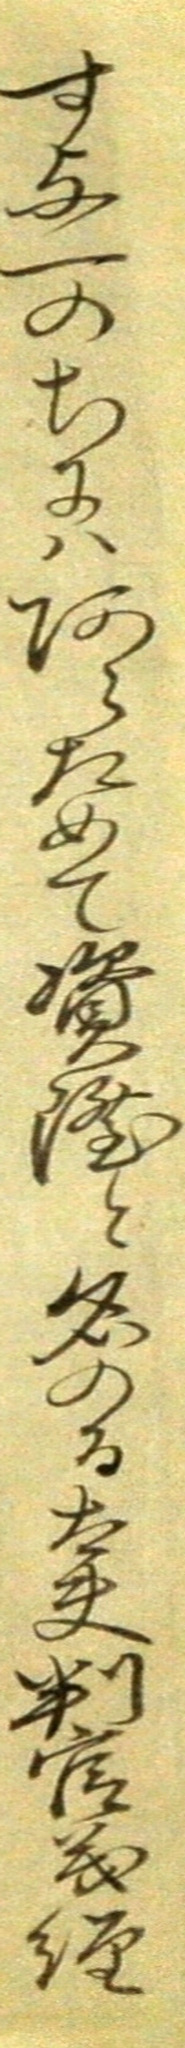す与一のちにはあらためて資隆と名のる大夫判官義経
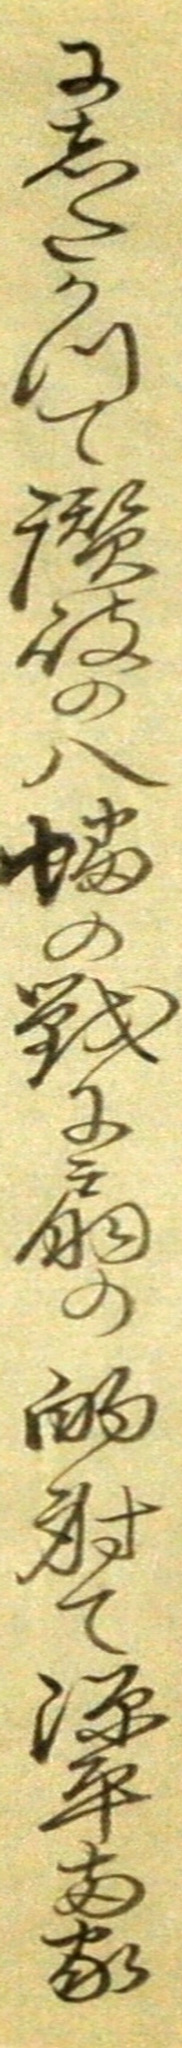にしたかつて讃岐の八幡の戦に扇の的射て源平両家
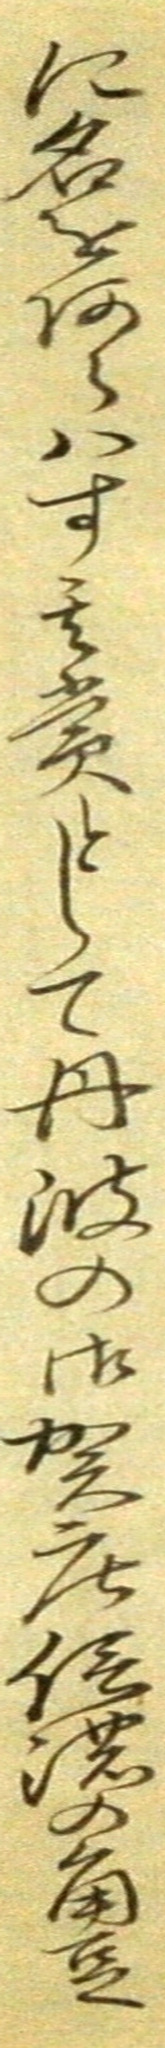に名をあらはす其賞として丹波の御賀庄信濃の角豆
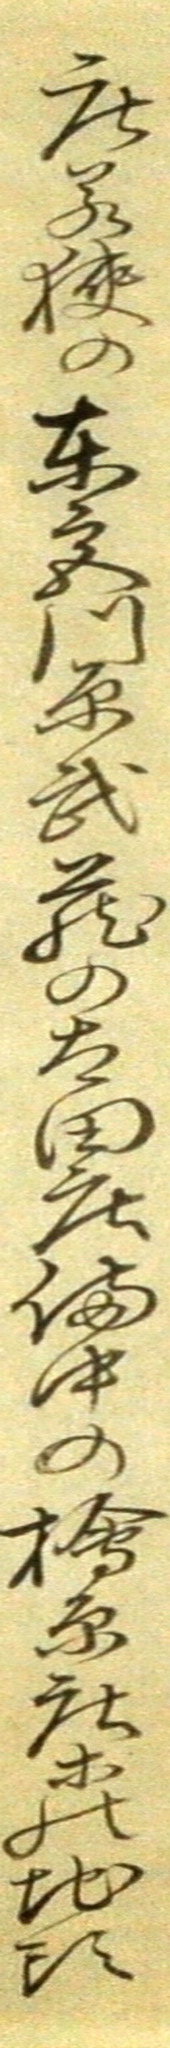庄若狭の東宮川原武蔵の太田庄備中の檜原庄等の地頭
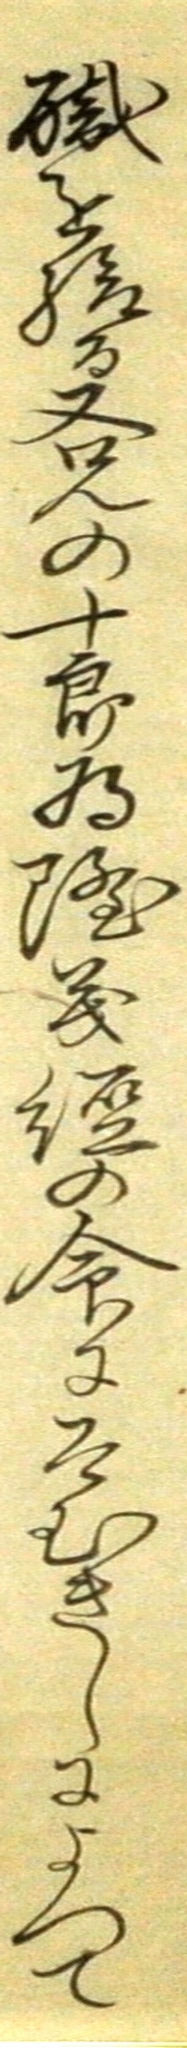職を給る又兄の十郎為隆義経の命にそむきしによつて
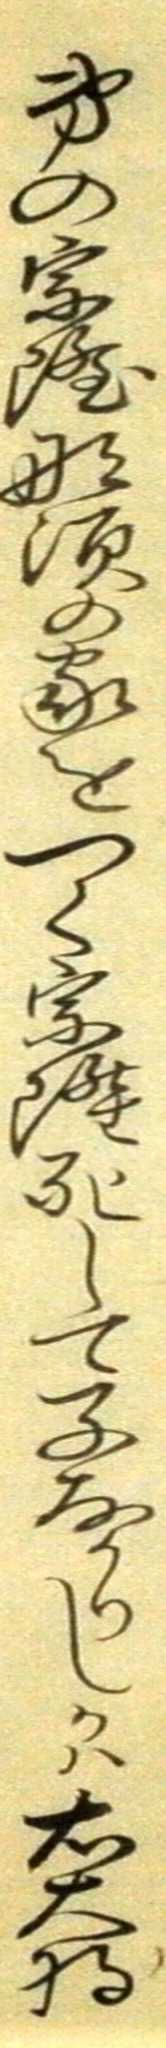弟の宗隆那須の家をつく宗隆死して子なかりしかは右大将
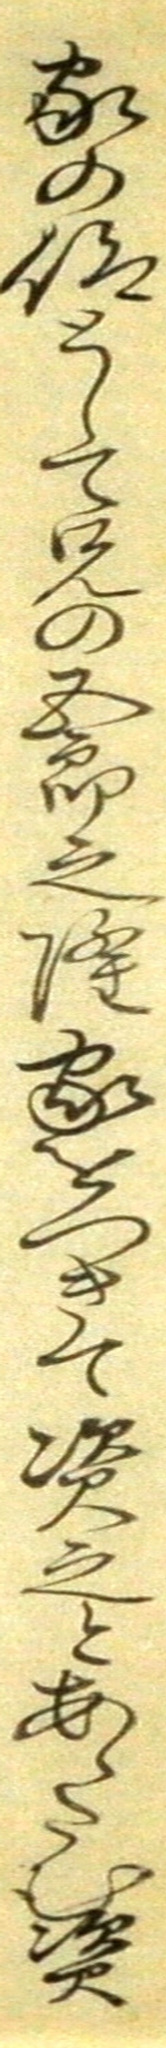家の仰として兄の五郎之隆家をつきて資之とあらたむ資
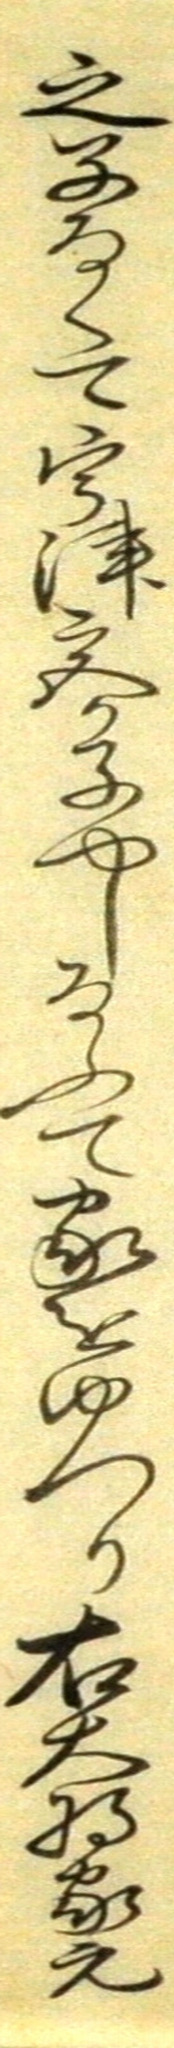之子なくて宇津宮か子やしなふて家をゆつり右大将家え
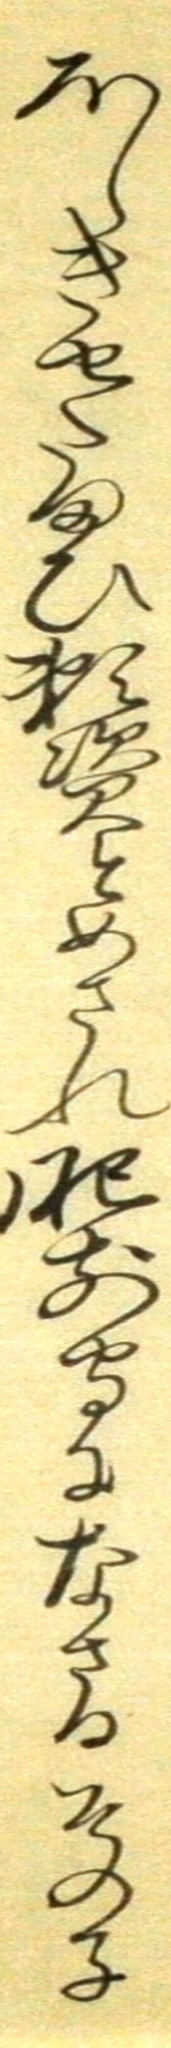ほしきせたまひ頼資とめされ肥前守になさるその子
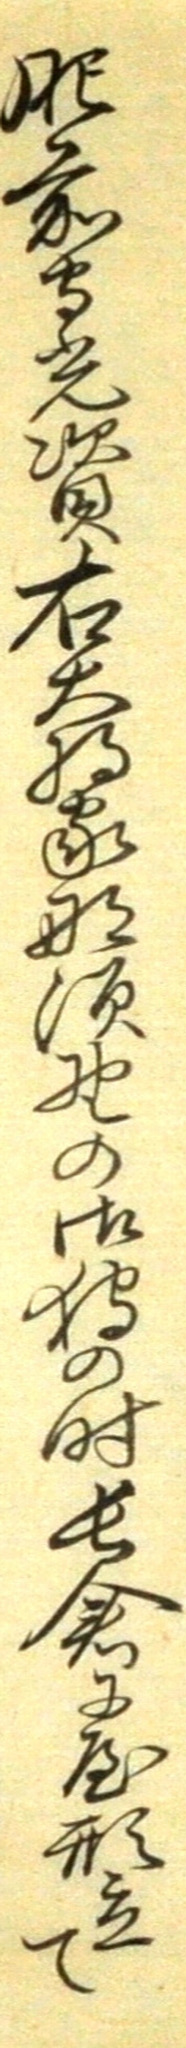肥前守光資右大将家那須野の御狩の時長倉に屋形立て
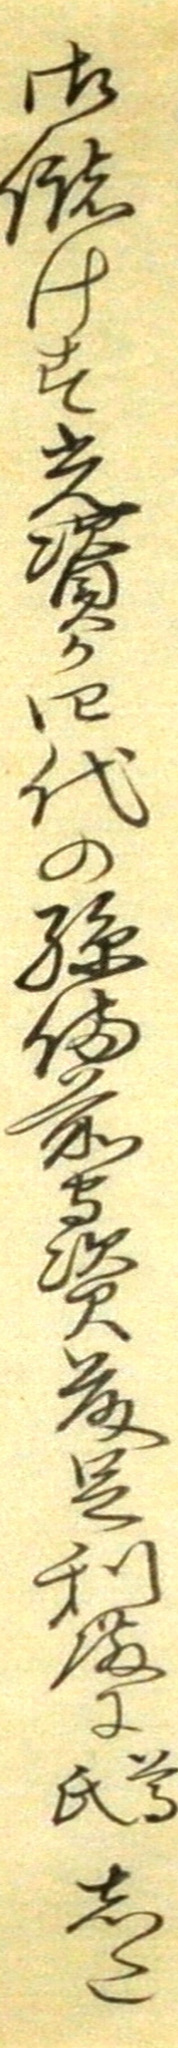御儲けす光資か四代の孫備前守資藤足利殿に尊氏した
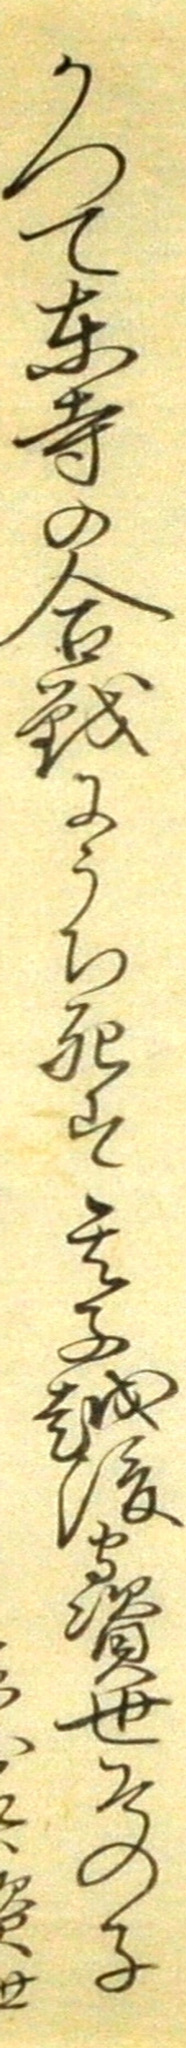かつて東寺の合戦にうち死す其子越後守資世その子
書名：藩翰譜（九・下）
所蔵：伊那市立高遠町図書館・合同会社AMANE
